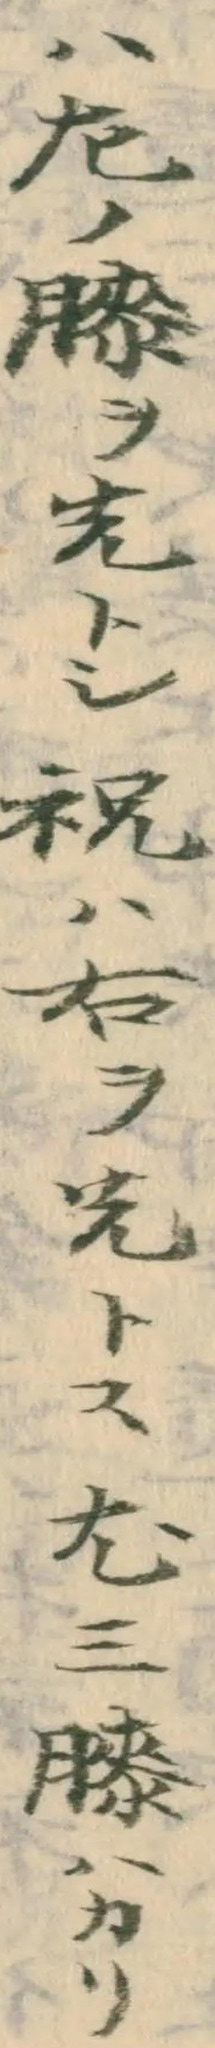ハ左ノ膝ヲ先トシ祝ハ右ヲ先トス尤三膝ハカリ
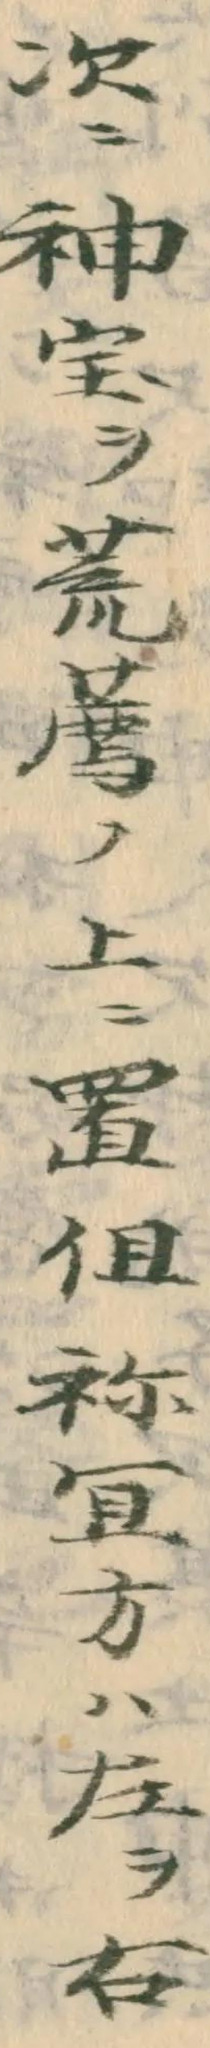次ニ神宝ヲ荒薦ノ上ニ置但禰宜方ハ左ヲ右
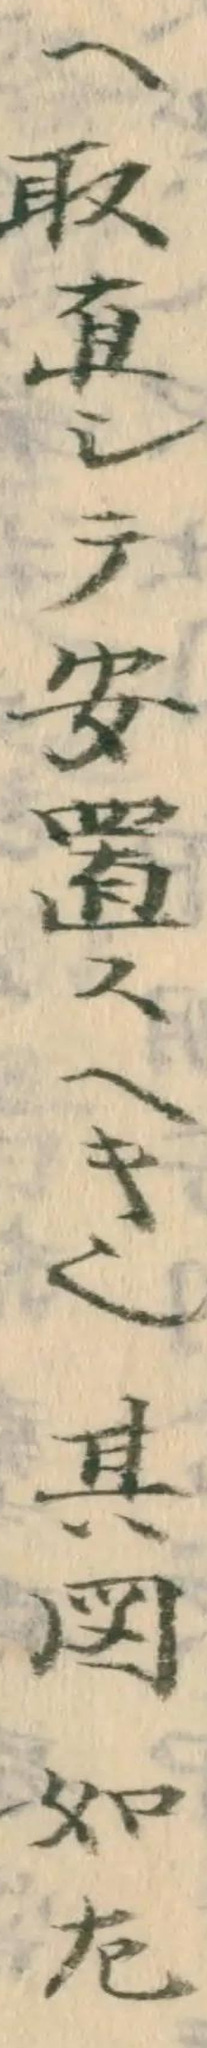ヘ取直シテ安置スヘキ也其図如左
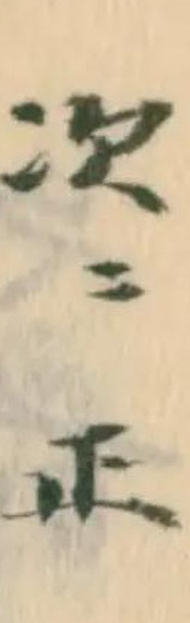次ニ正
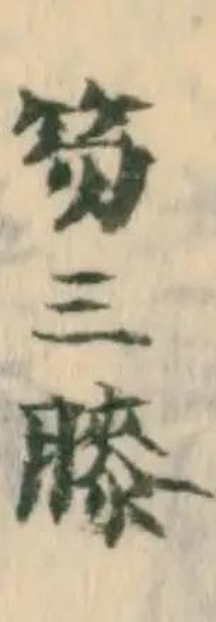笏三膝
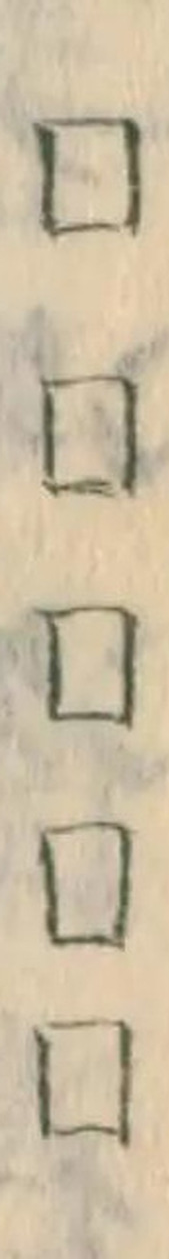石段同同同
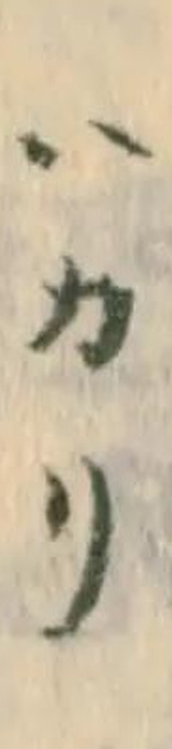ハカリ
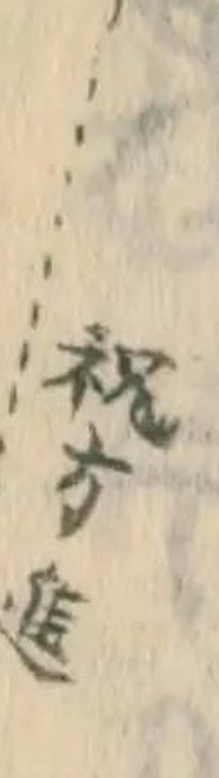祝方進
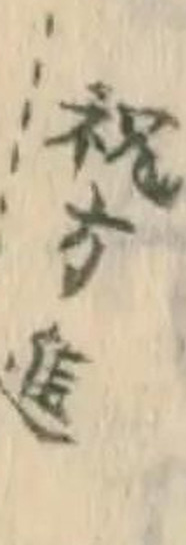祝方進
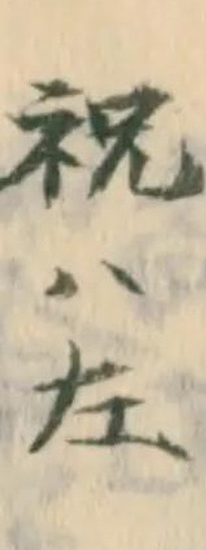祝ハ左
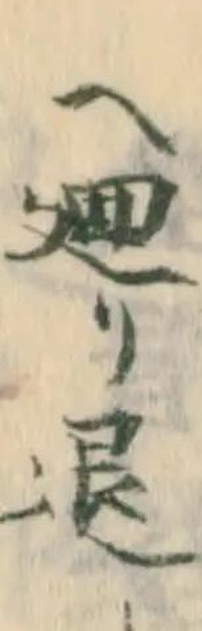へ廻リ退
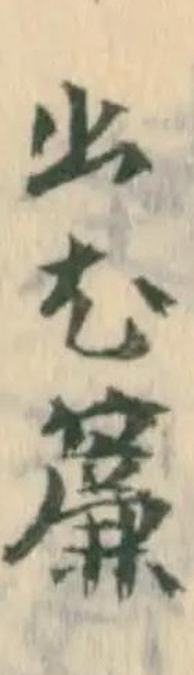出尤簾
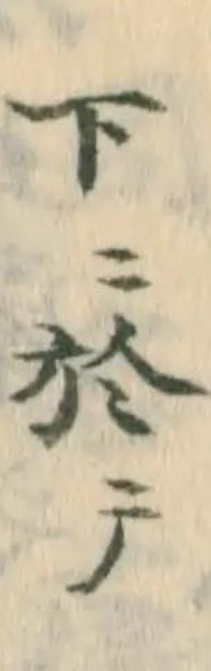下ニ於テ
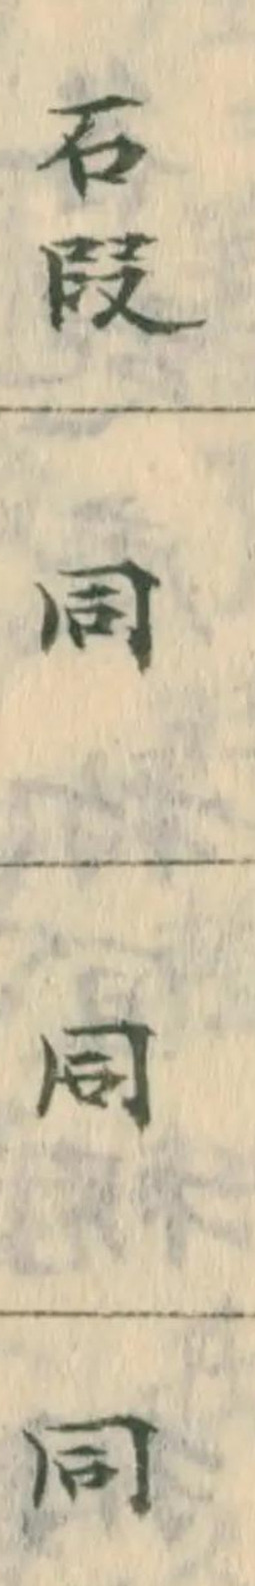石段同同同
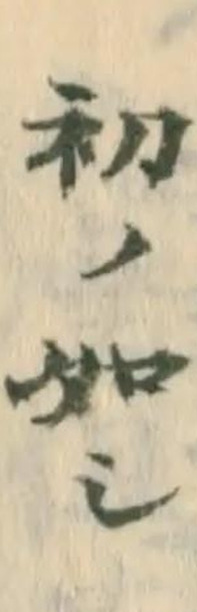初ノ如シ
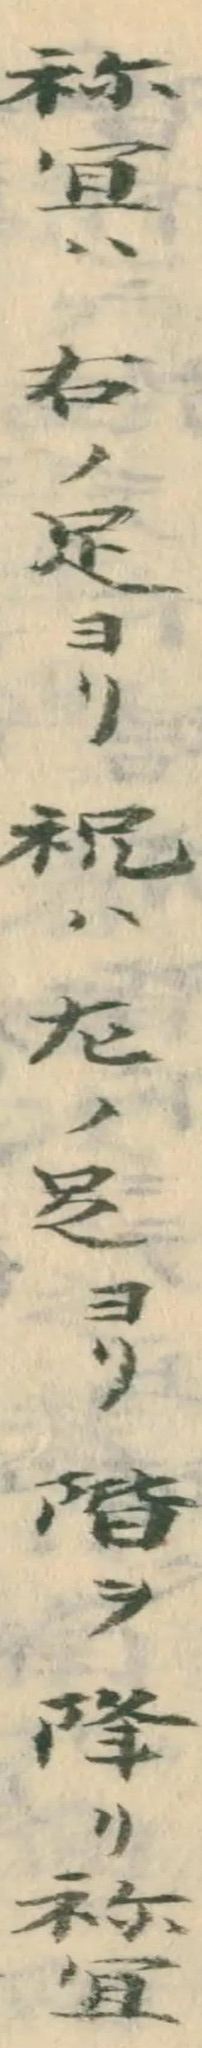禰宜ハ右ノ足ヨリ祝ハ左ノ足ヨリ階ヲ降リ禰宜
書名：賀茂社記録. 第5冊
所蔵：国立国会図書館 National Diet Library, JAPAN
